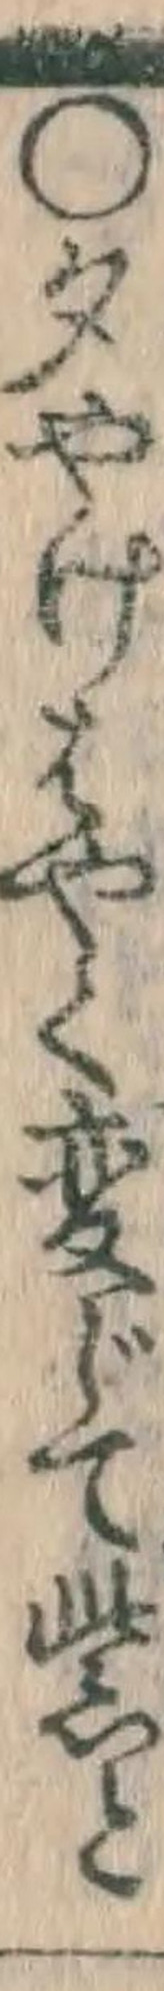○夕やけはやく変じて紫と
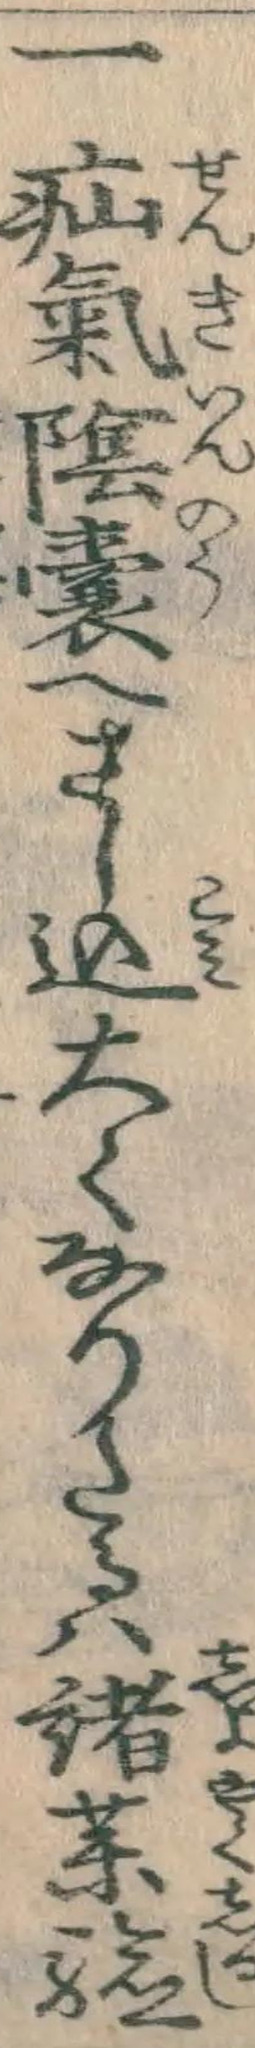一疝気陰嚢へさし込大くなりたるは諸薬験
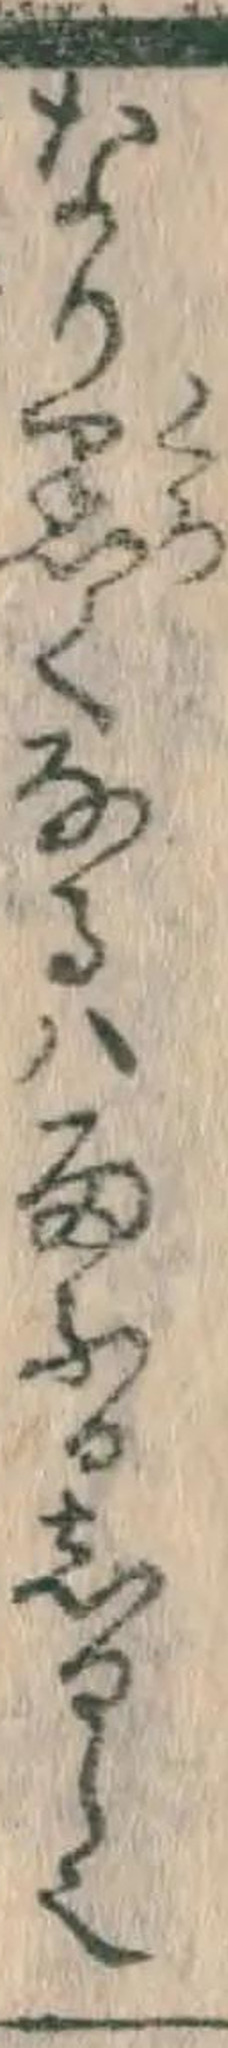なり黒くなるは雨ふるしるし也
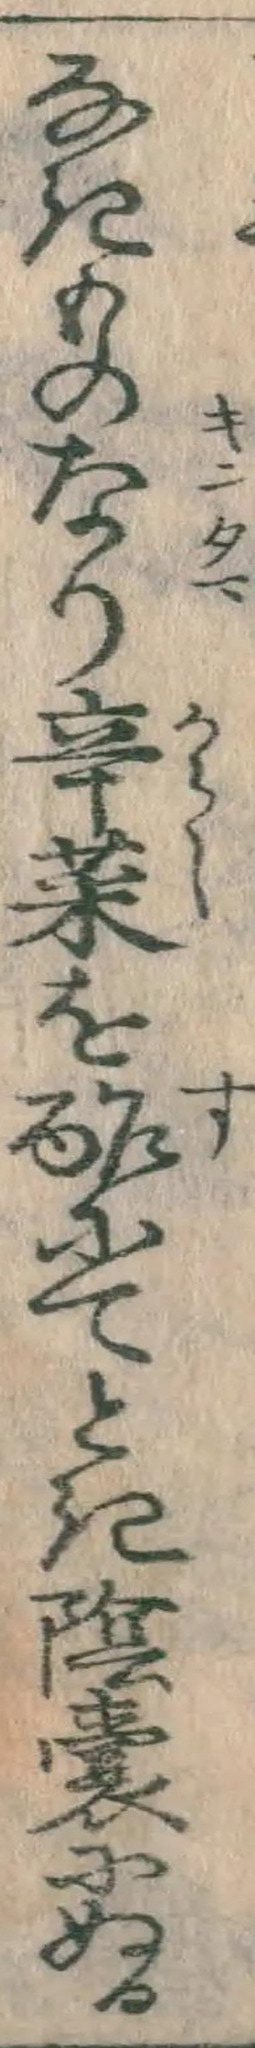なきものなり辛菜を酢にてとき陰嚢にぬる
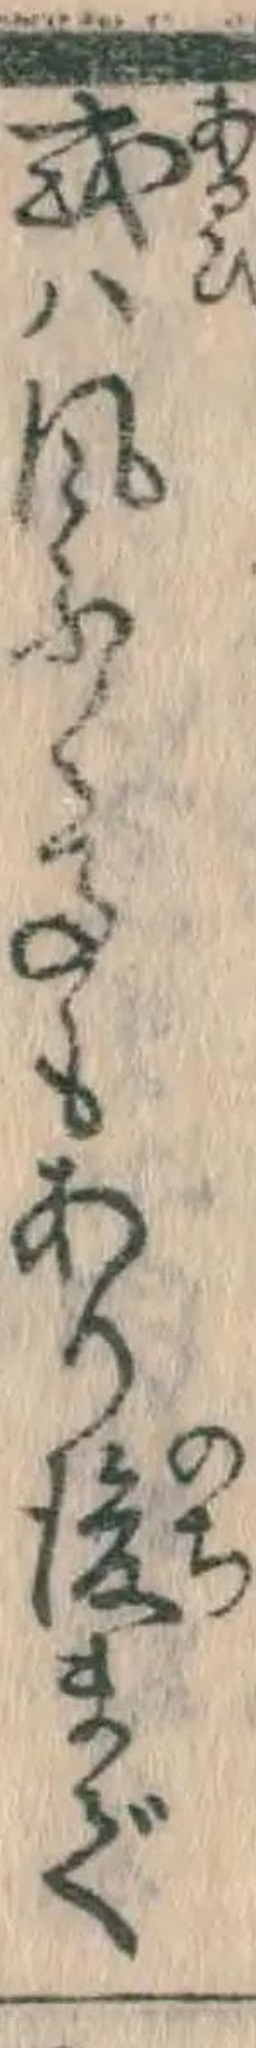或は風ふく事もあり後まで
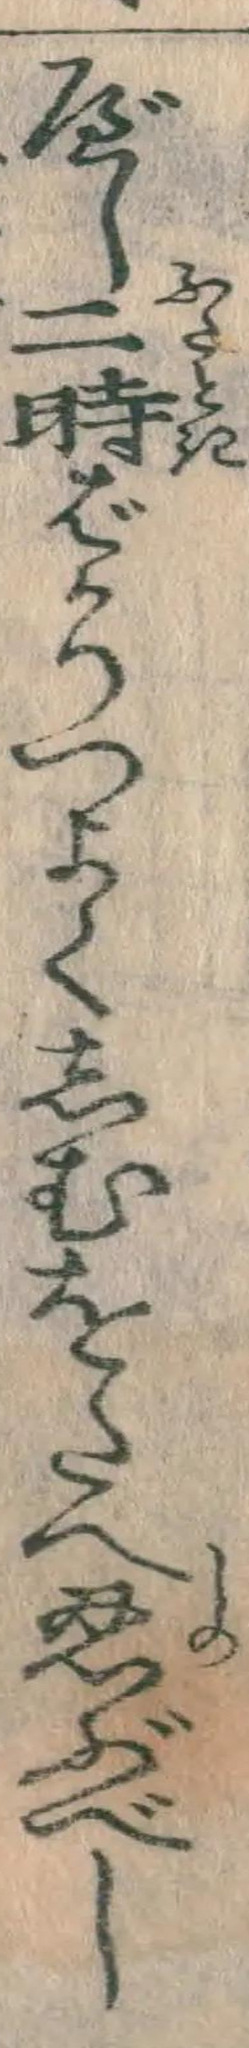べし二時ばかりつよくしむをたへ忍ぶべし
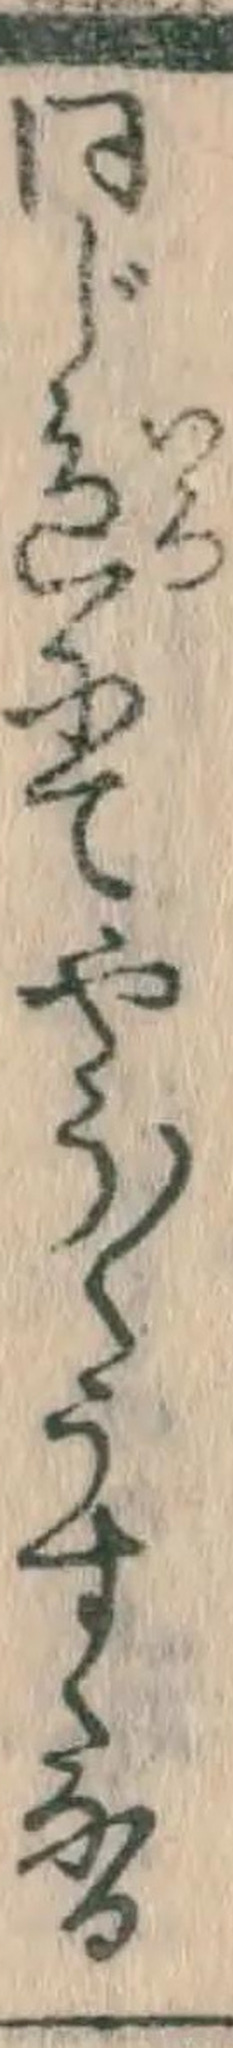同じ色にてやう〳〵うすくなる
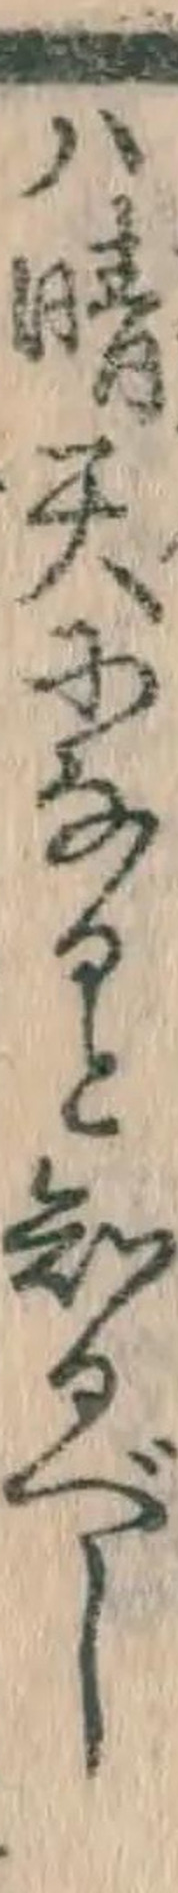は晴天になると知るべし
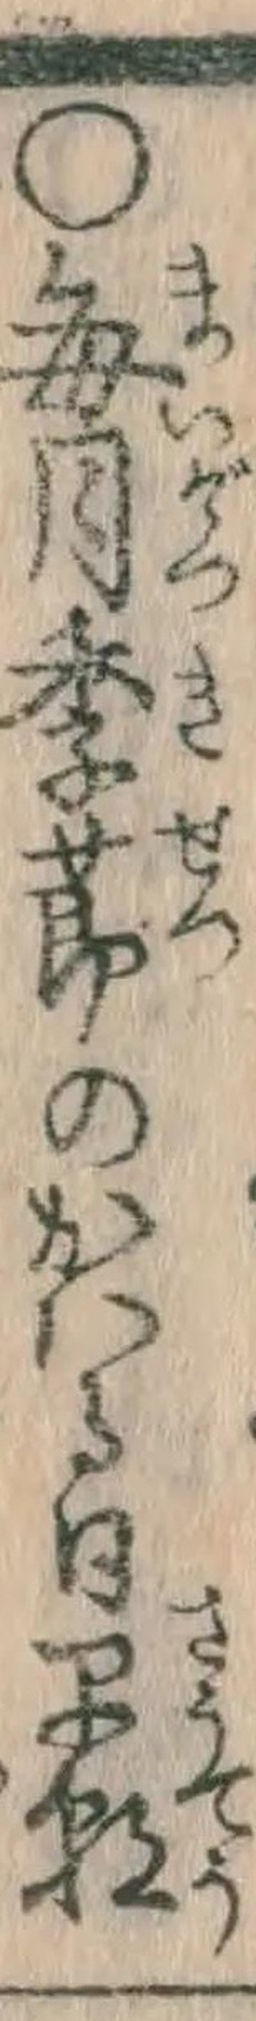○毎月季節のかはる日早朝
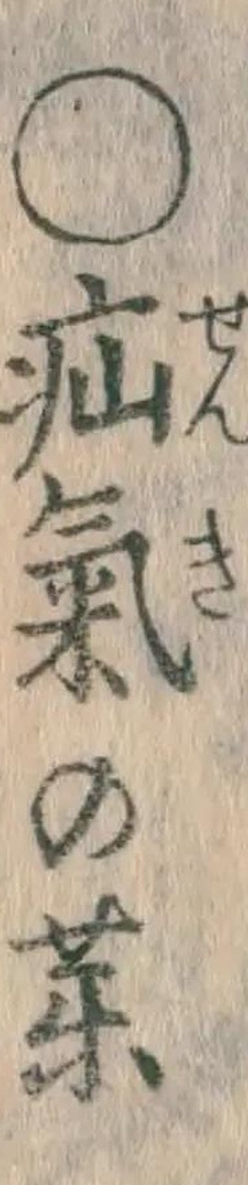○疝気の薬
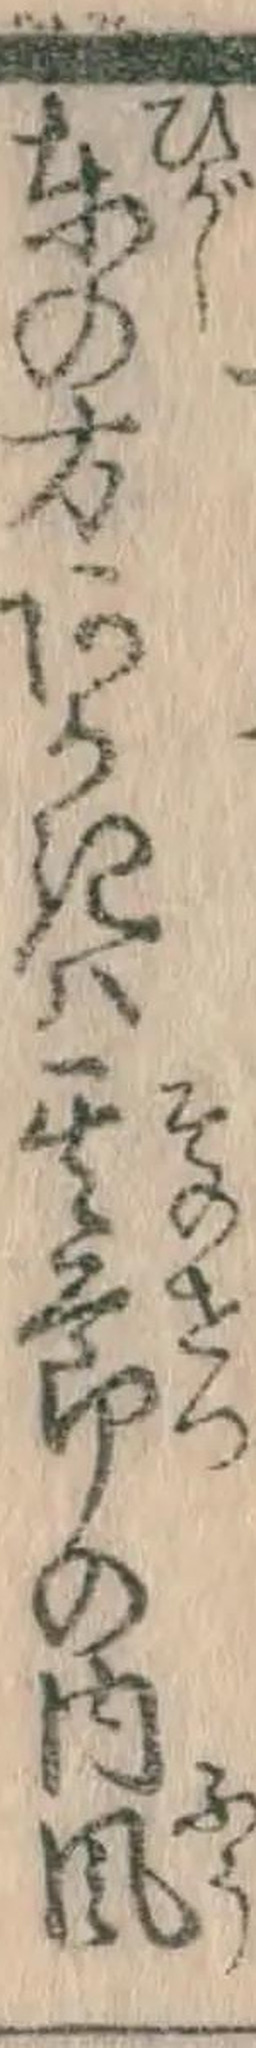東の方あかきは其節の内風
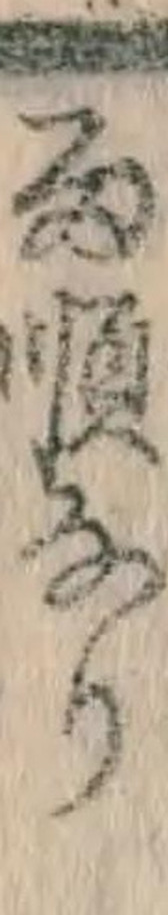雨順なり
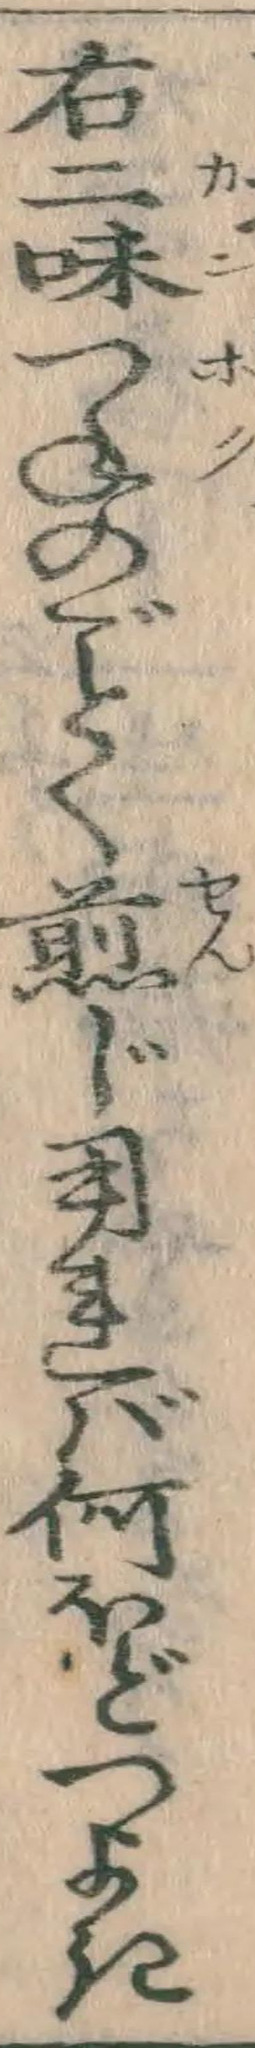右二味つねのごとく煎じ用れば何ほどつよき
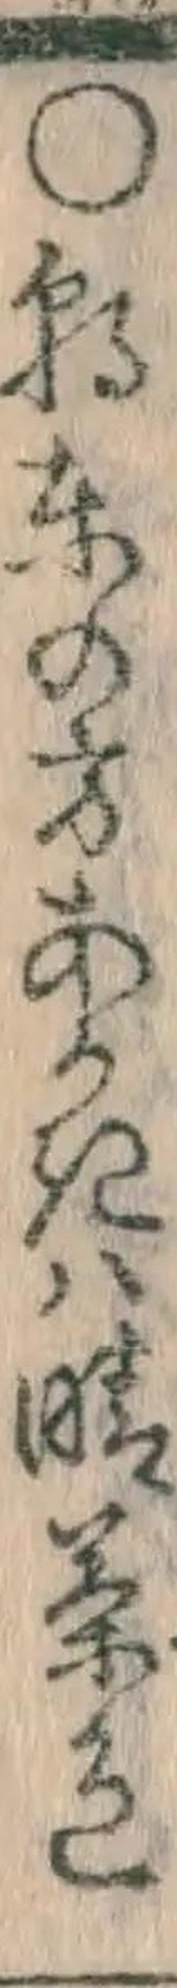○朝東の方あかきは晴茶色
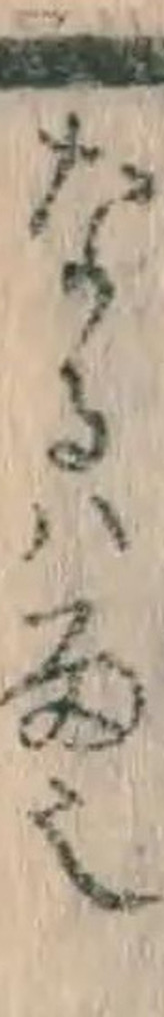なるは雨也
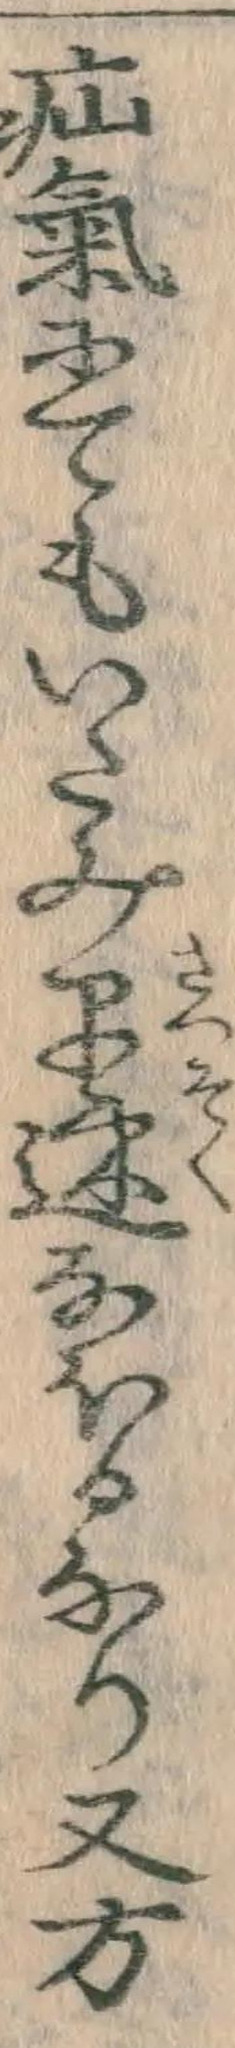疝気にてもいたみ早速なほるなり又方
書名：広益秘事大全 3巻. [4]
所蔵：国立国会図書館 National Diet Library, JAPAN
